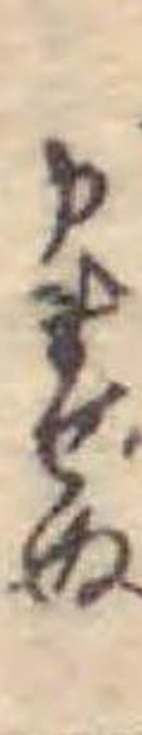申ませぬ
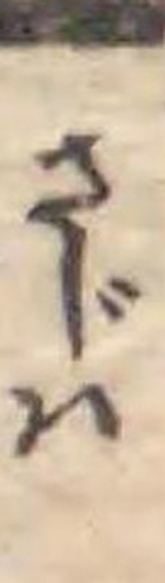さじは
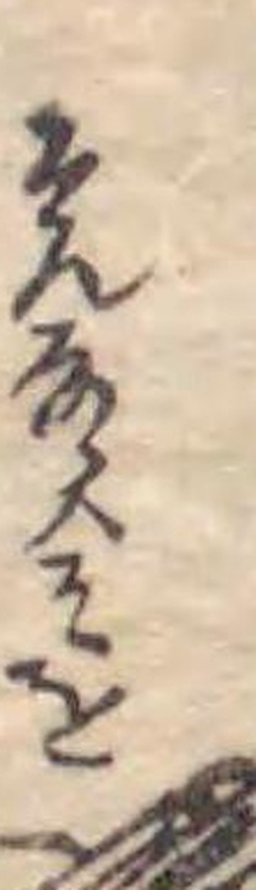そんなら金を
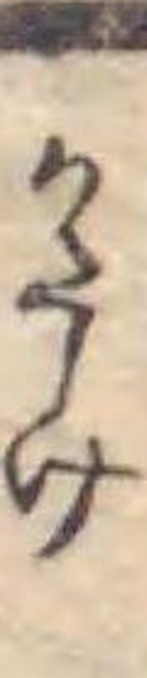かたしけ
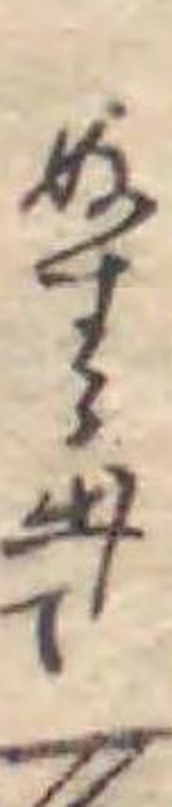ぬすみ出して
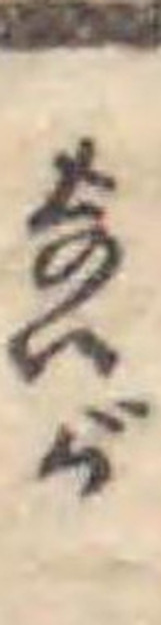ないが
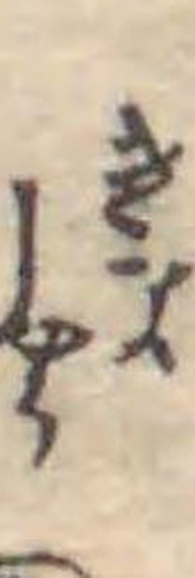しやう
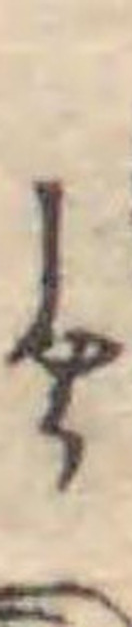しやう
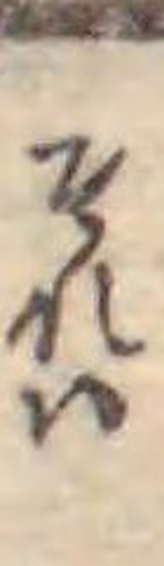それは
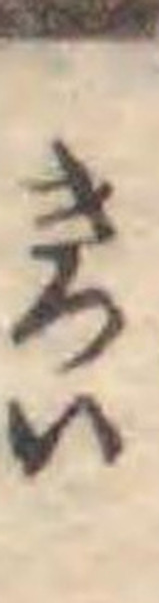きつい
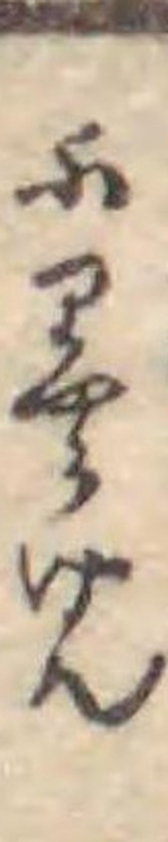ふりやうけん
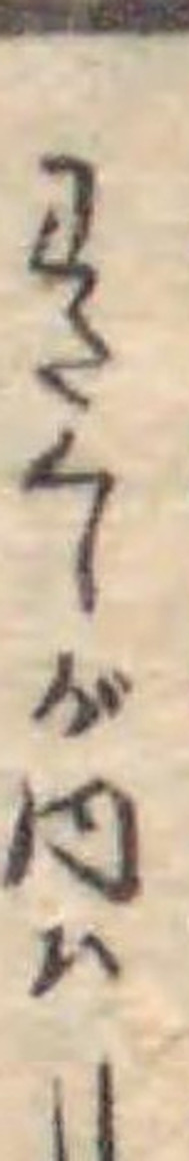わたくしが内は
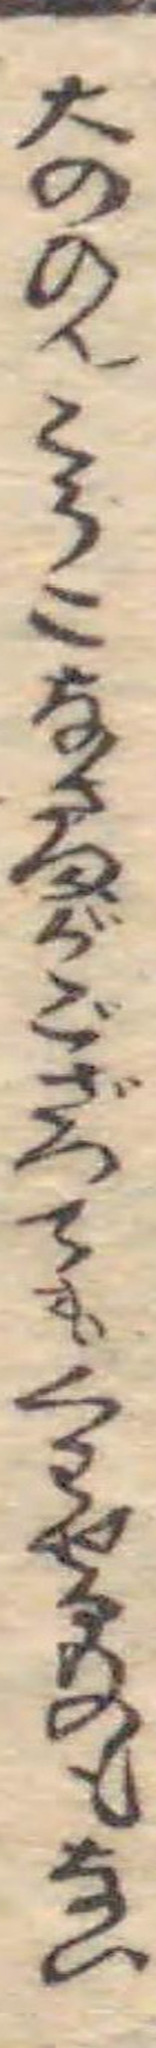大のひんこうこなさまがござつてもくわせるものもない
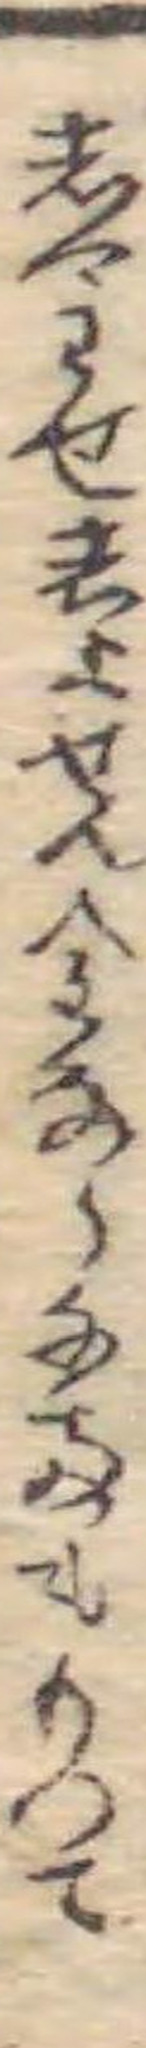しやわせしよせん金なら千両ももつて
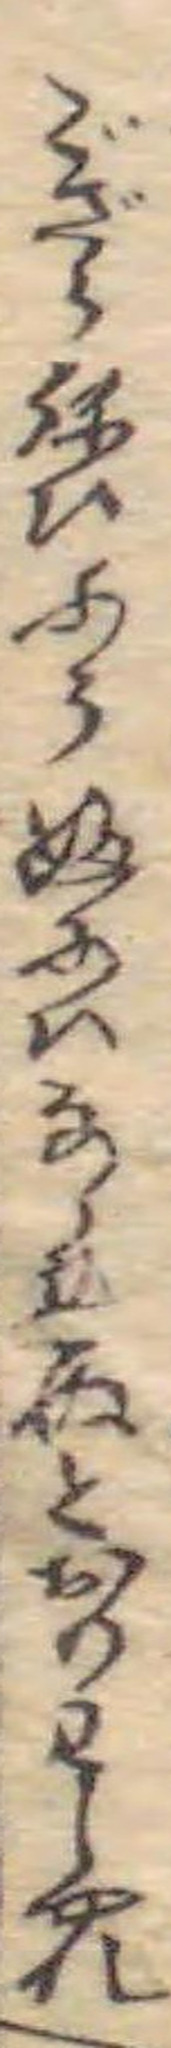ござらねはふうふにはなられぬとおもわしやれ

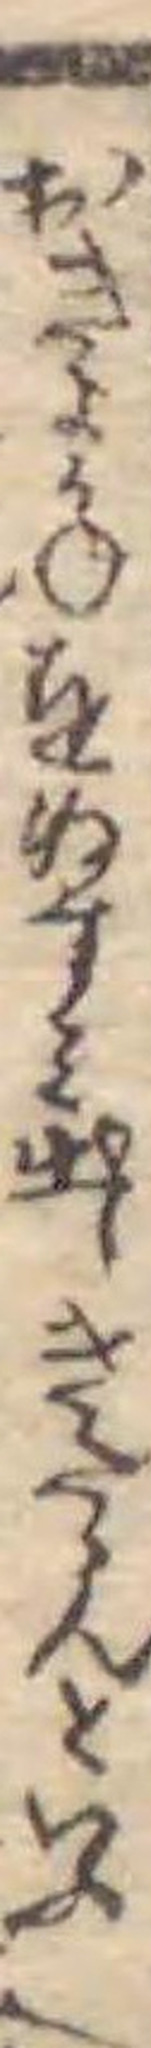おきよかねをぬすみ出しきたらんといふ
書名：鐘入七人化粧 : 3巻
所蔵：国立国会図書館 National Diet Library, JAPAN
